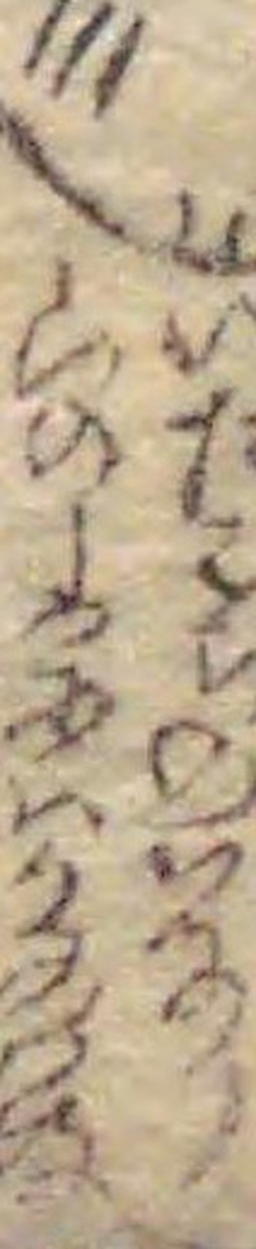山のしゆにはかなはぬ
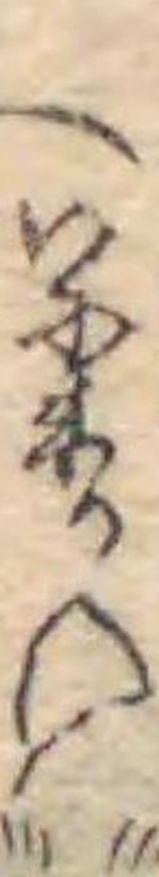いに来り
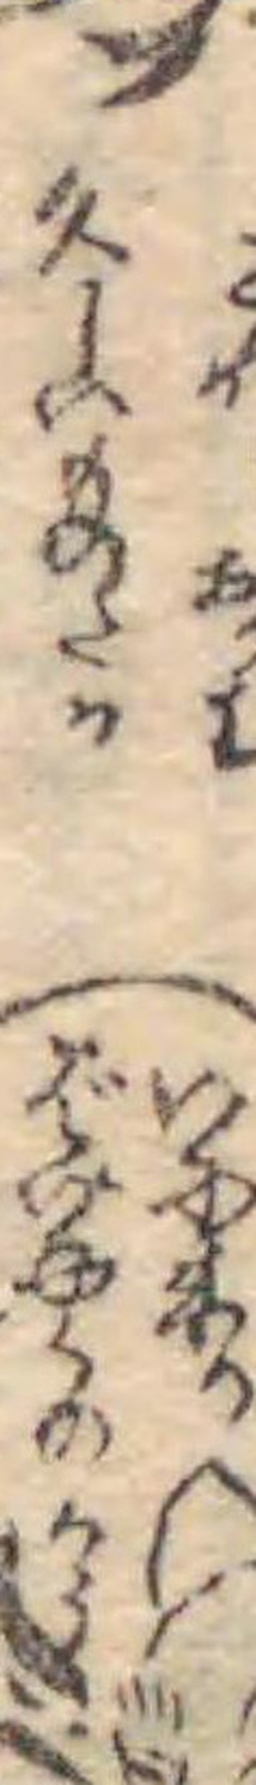久しいものたか
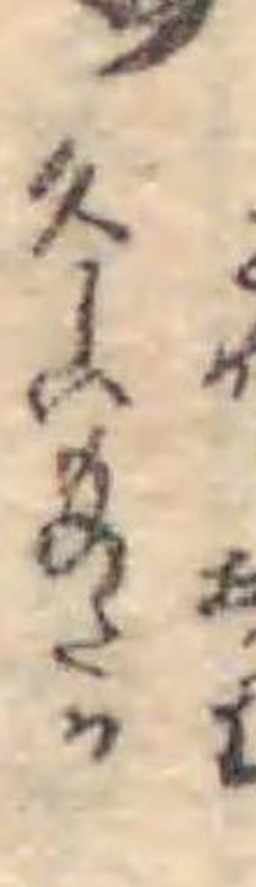久しいものたか
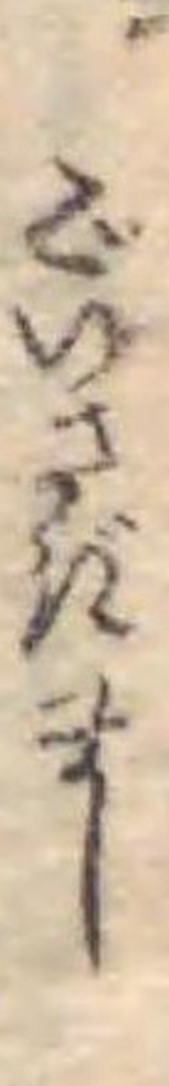ごいさぎまし
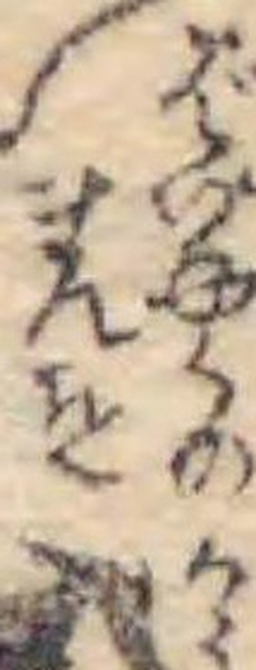まんを
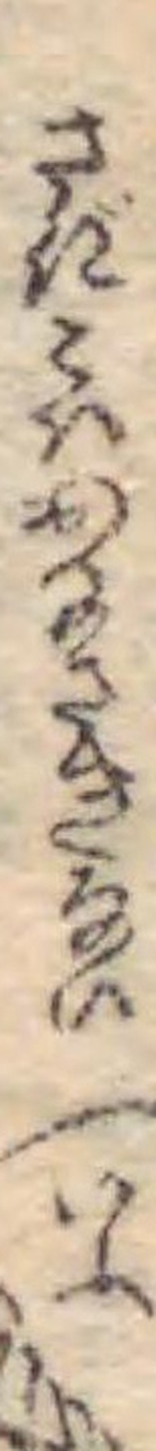さぎとはおなさきない
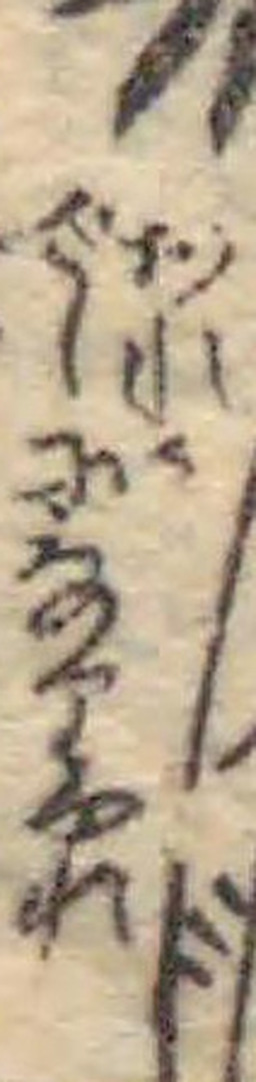でしになァやれ
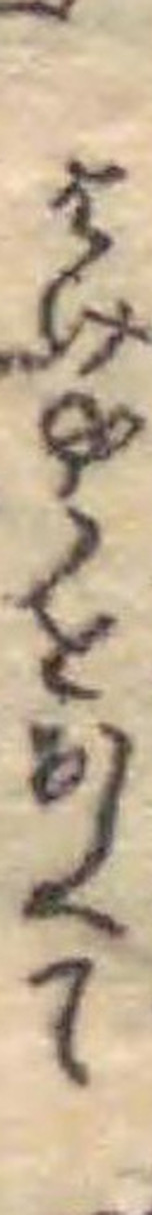はけやうをおしへて
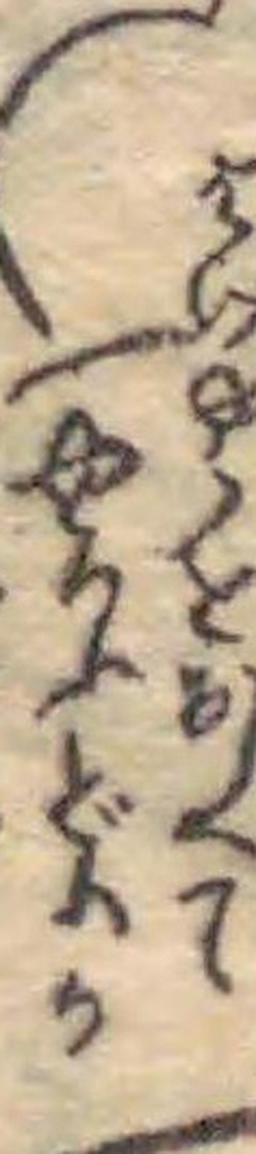やろふどか
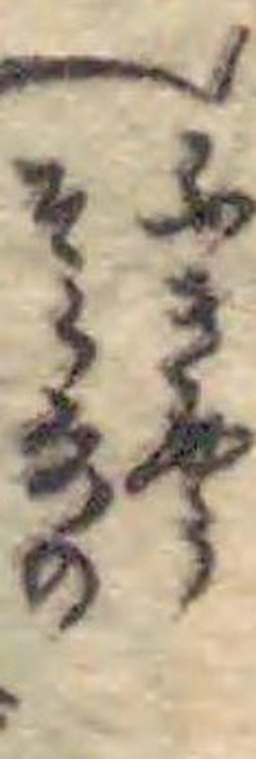そうなの
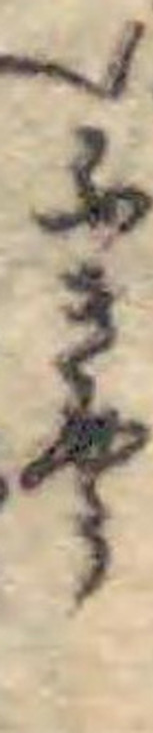ふきやう
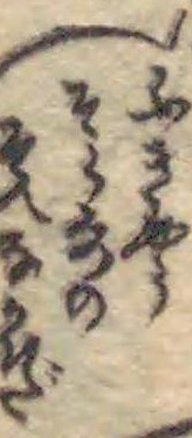そうなの
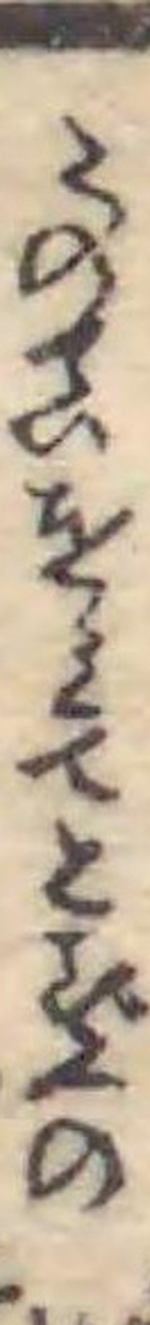このていをみてずへの
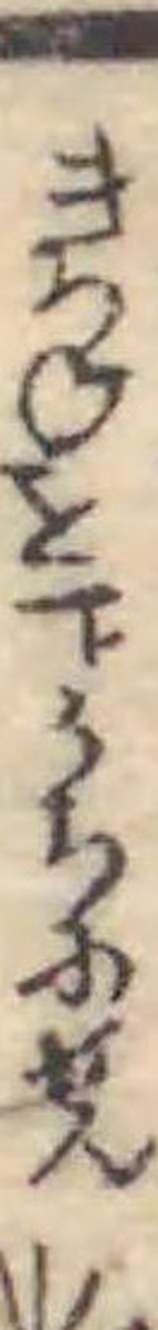きつねを下？うちにせん
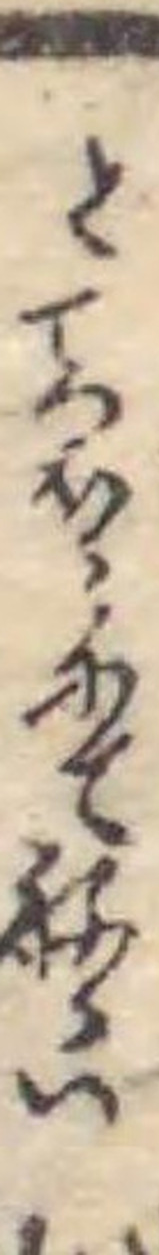とてつほうにてねらい
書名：鐘入七人化粧 : 3巻
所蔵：国立国会図書館 National Diet Library, JAPAN
